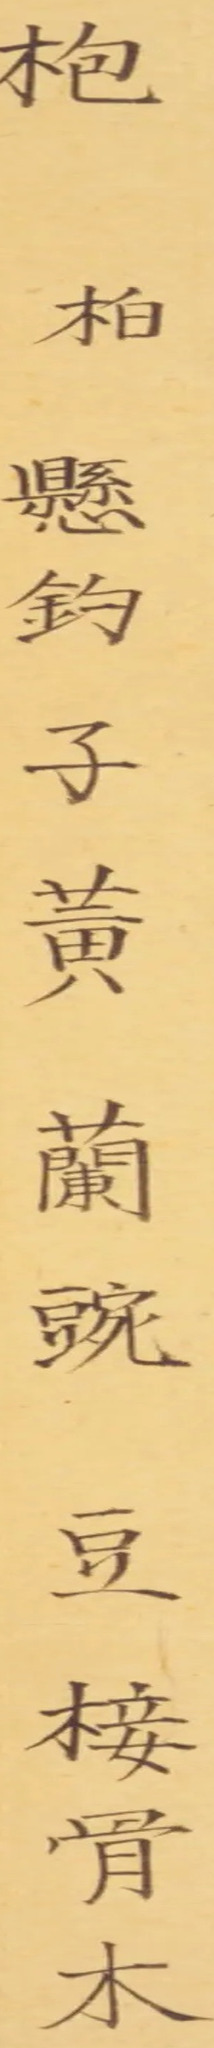枹柏懸釣子黄蘭豌豆接骨木
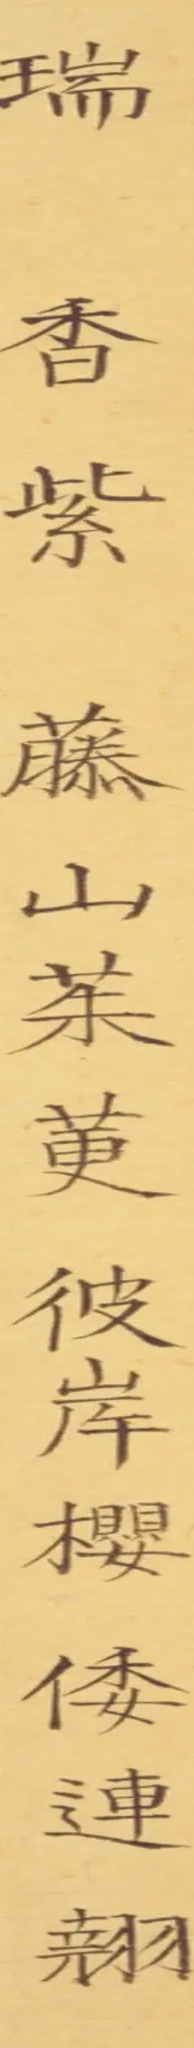瑞香紫藤山茱萸彼岸桜倭連翹
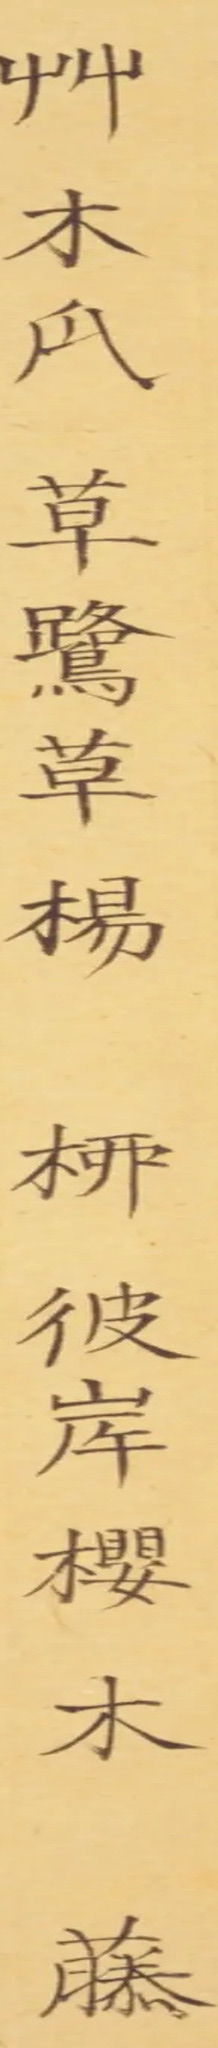艸木瓜草鷺草柳楊彼岸桜木藤
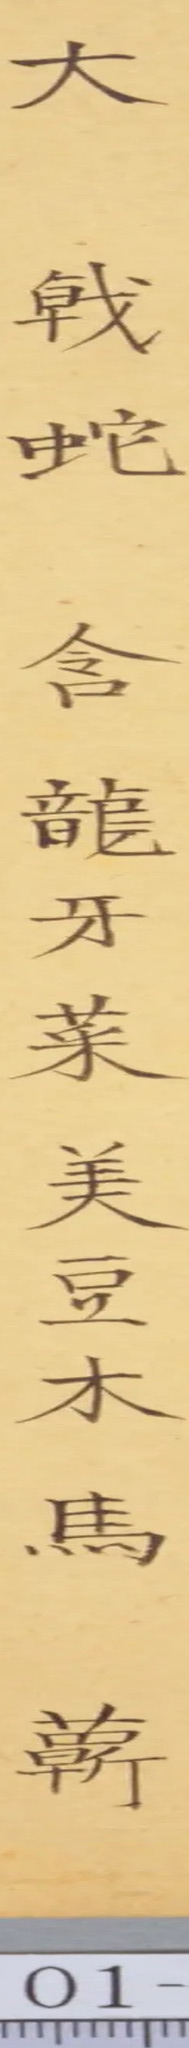大戟蛇含竜牙菜美豆木馬
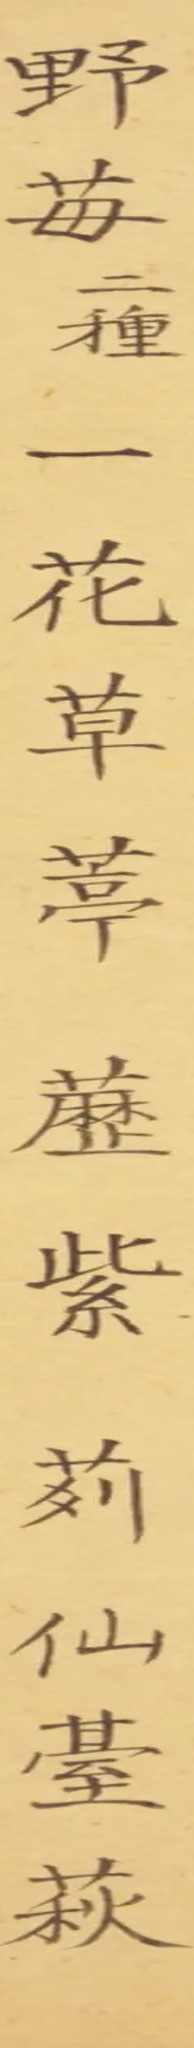野苺二種一花草葶紫荊仙台萩
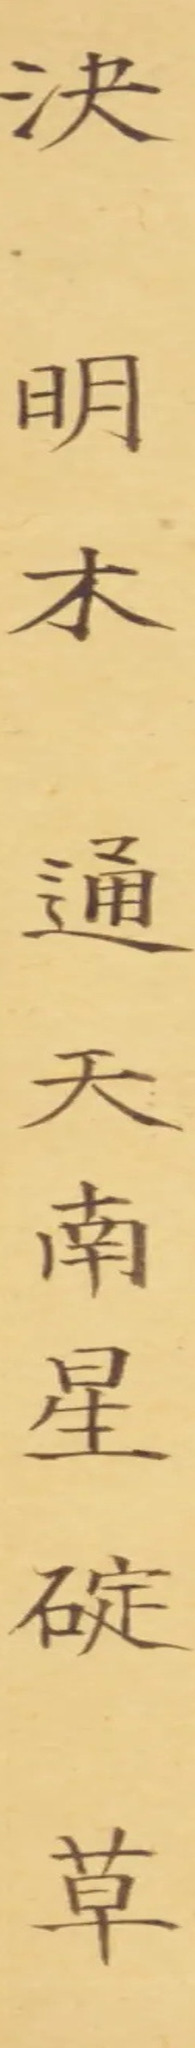決明木通天南星碇草
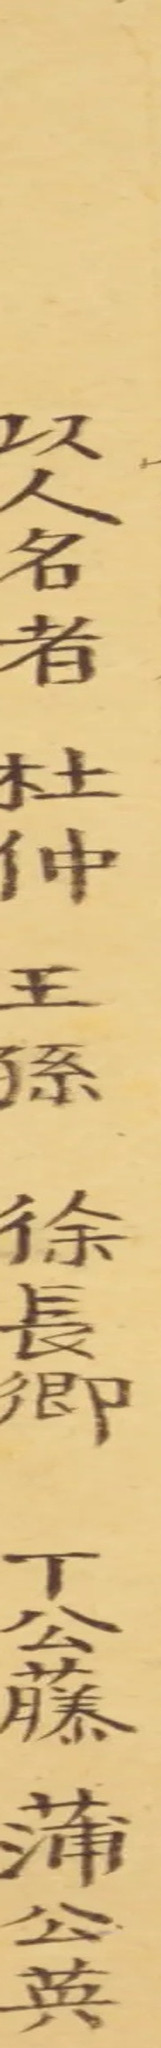以人名者杜仲王孫徐長丁公藤蒲公英
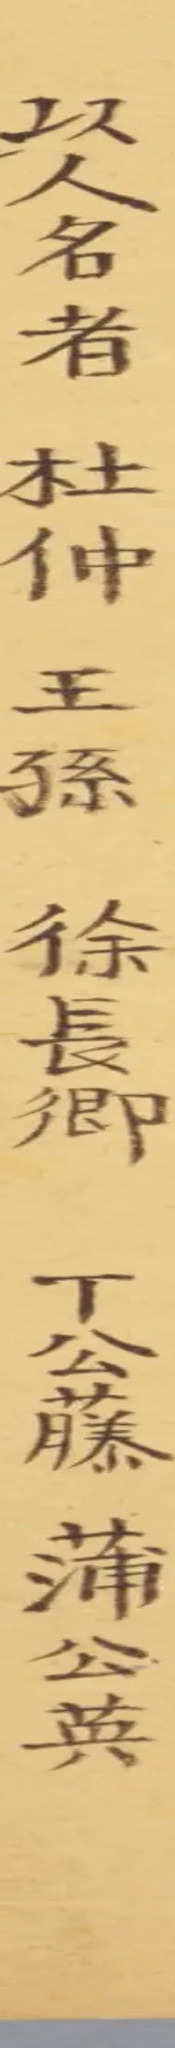以人名者杜仲王孫徐長丁公藤蒲公英
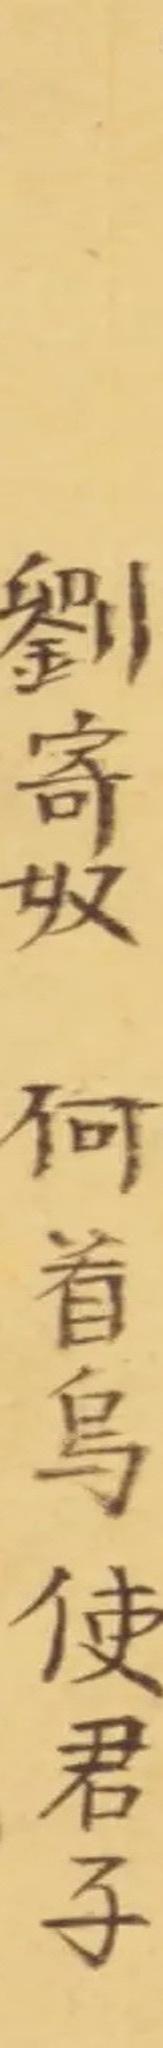劉寄奴何首烏使君子
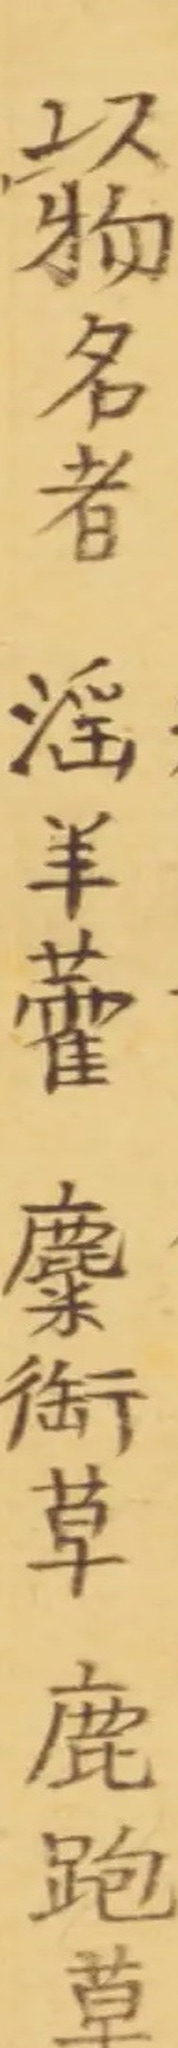以物名者淫羊藿麋䘖草鹿跑草
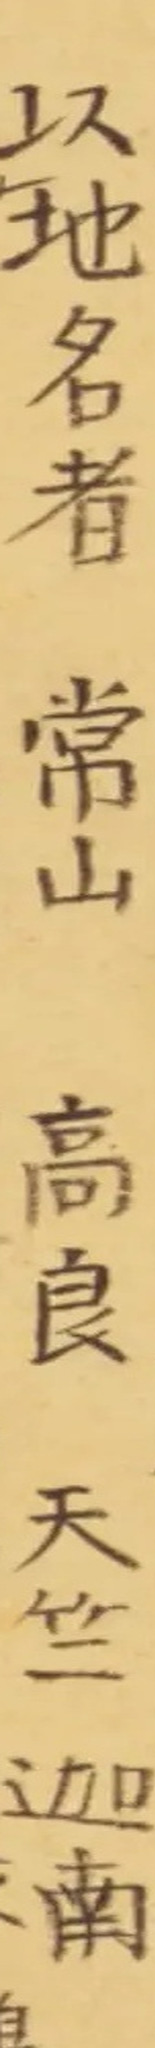以地名者常山高良天竺迦南
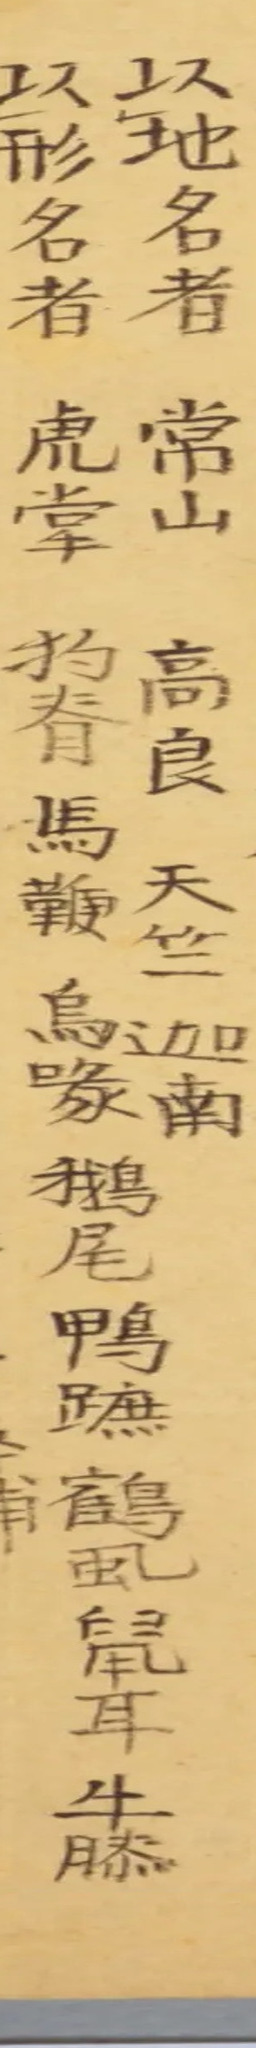以形名者虎掌狗背馬鞭烏喙鵝尾鴨蹠鶴虱鼠耳牛膝
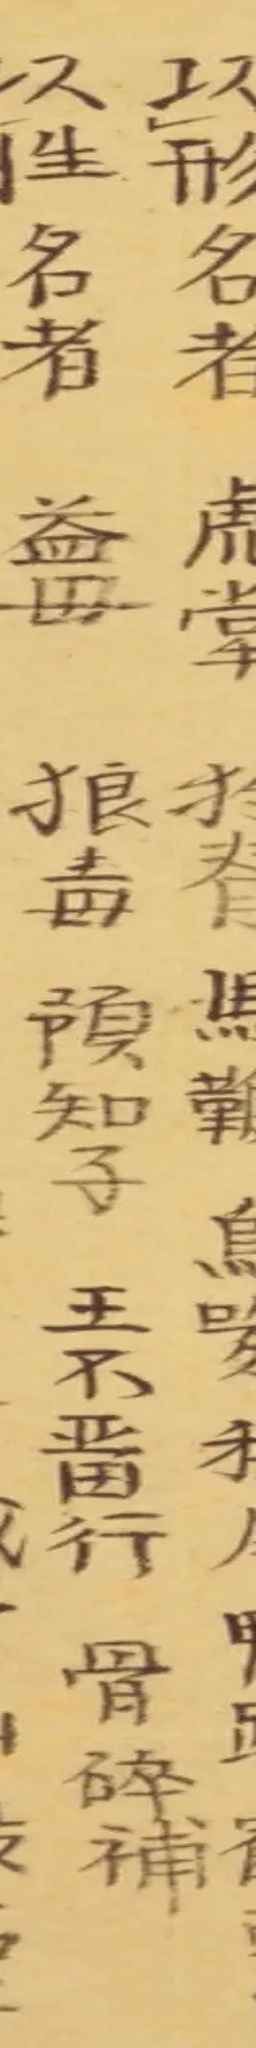以性名者益母狼毒預知子王不晋行骨砕補
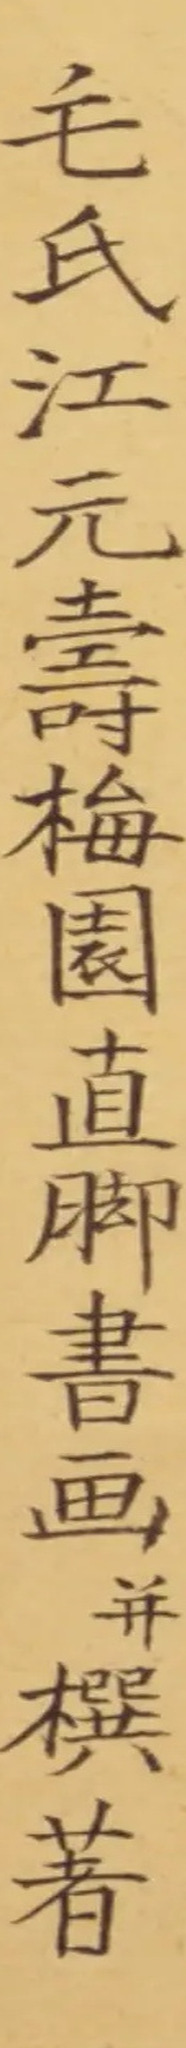毛氏江元寿梅園直脚書画并撰著

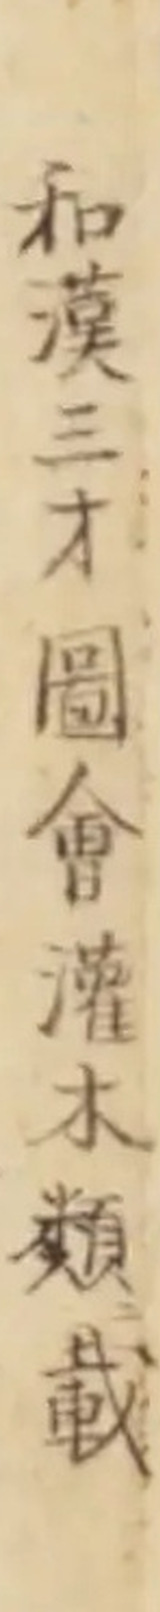和漢三才図会灌木類載
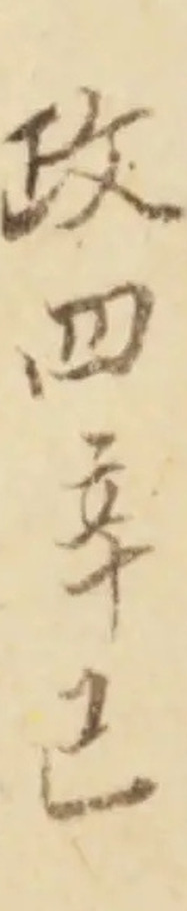政四辛巳
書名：梅園草木花譜春之部. 1
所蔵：国立国会図書館 National Diet Library, JAPAN
